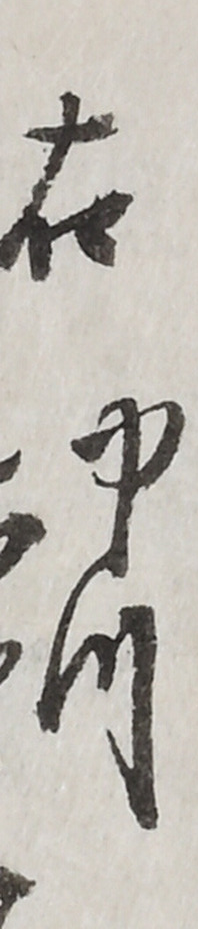右中町
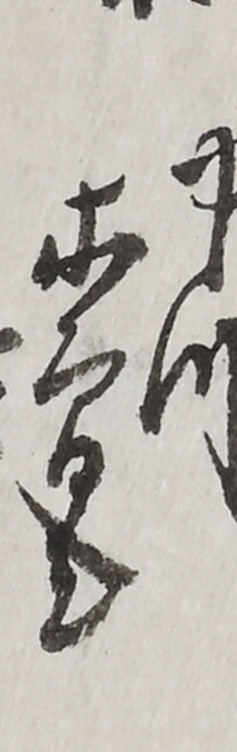木曽屋
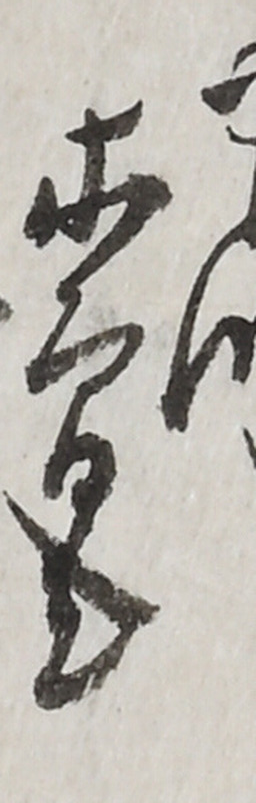木曽屋
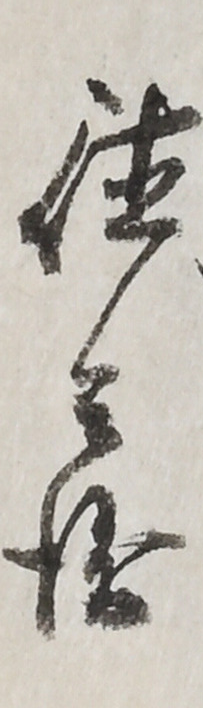徳兵衛
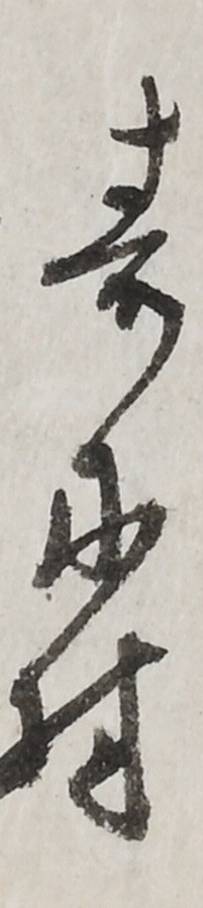表木村
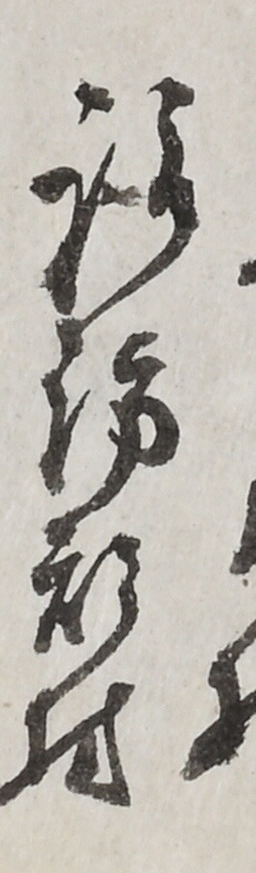諏訪形村
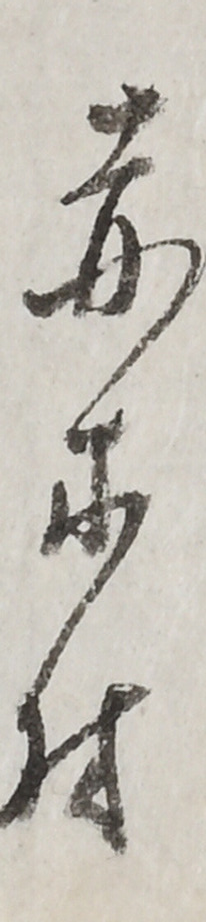赤木村
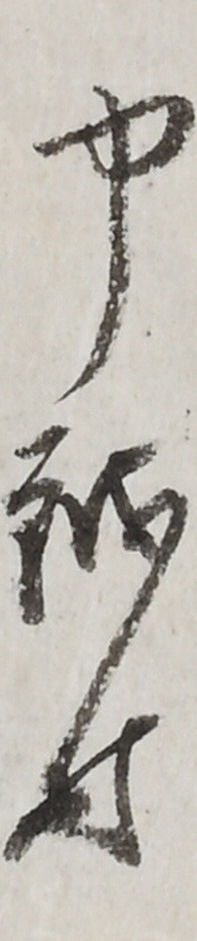中越村
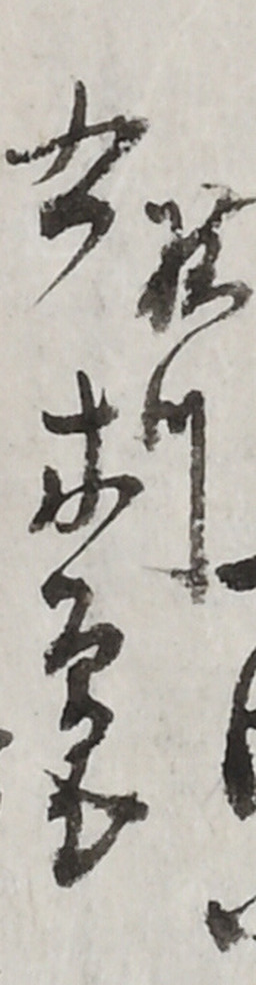右木曽屋
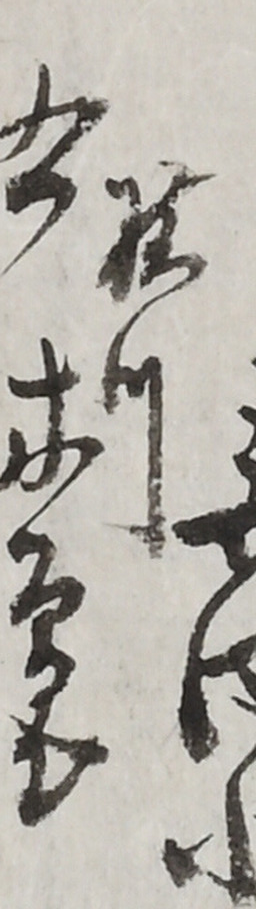右木曽屋

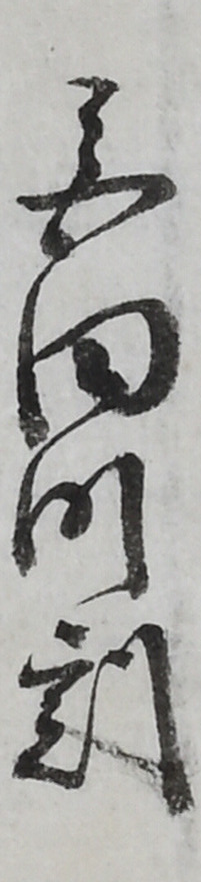宮田町割
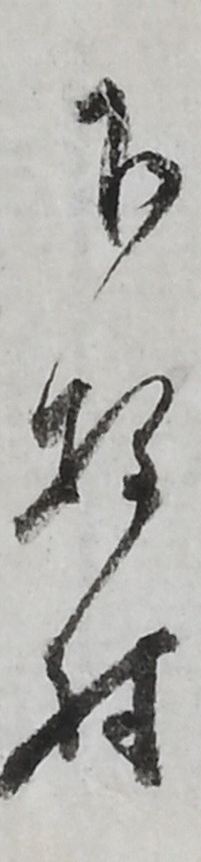下牧村
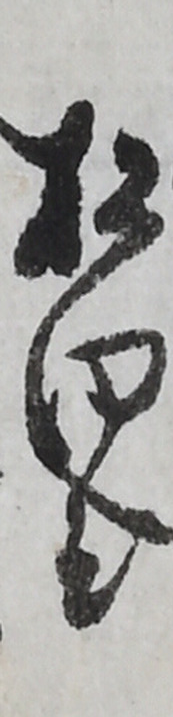松田屋
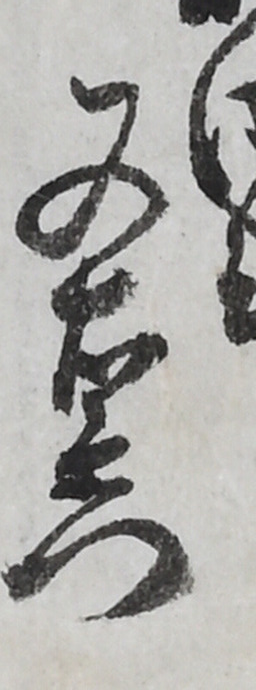又右衛門
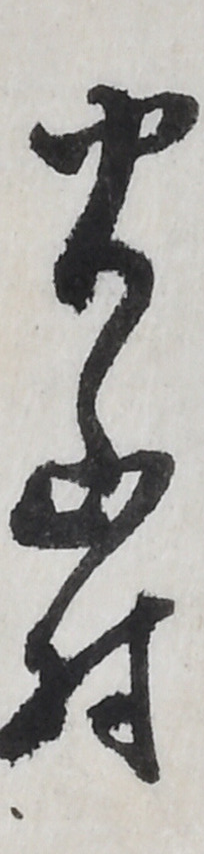火山村
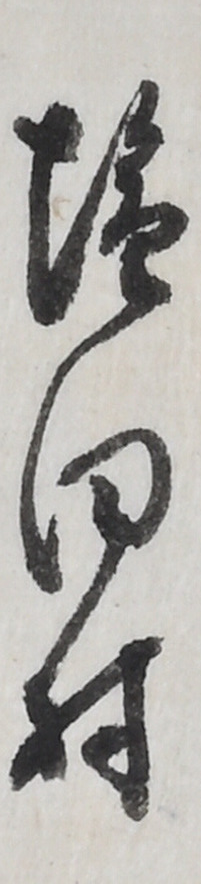塩田村
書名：年内行事帳
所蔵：伊那市立高遠町図書館・合同会社AMANE
